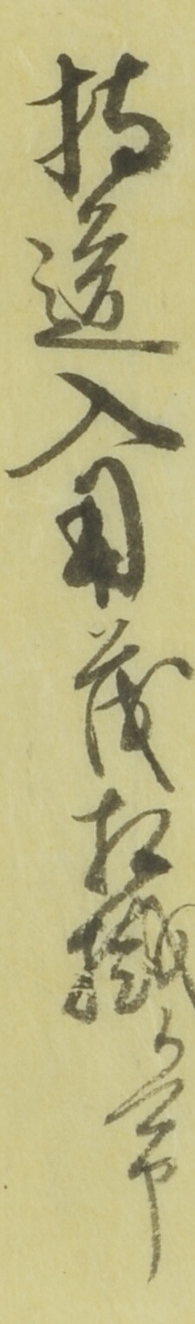持道入用も相掛り可申

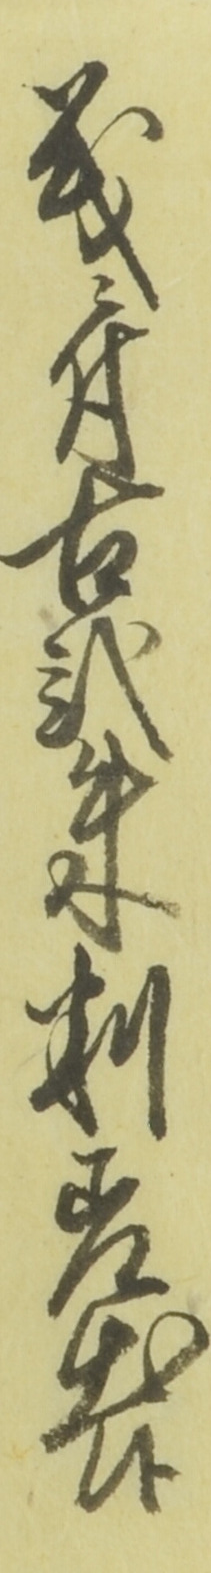義ニ付古弐朱判差出候
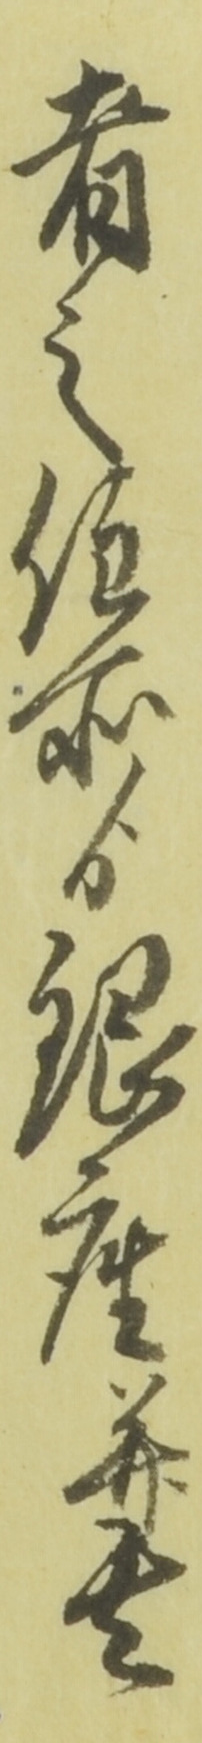者之住所ゟ銀座并其
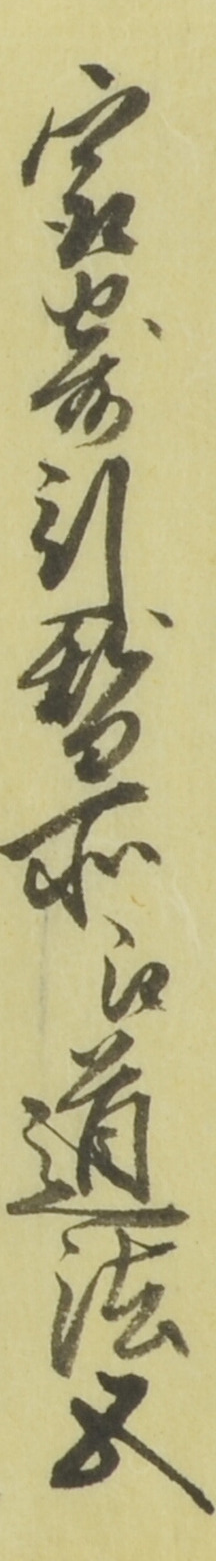最寄引替所江道法五
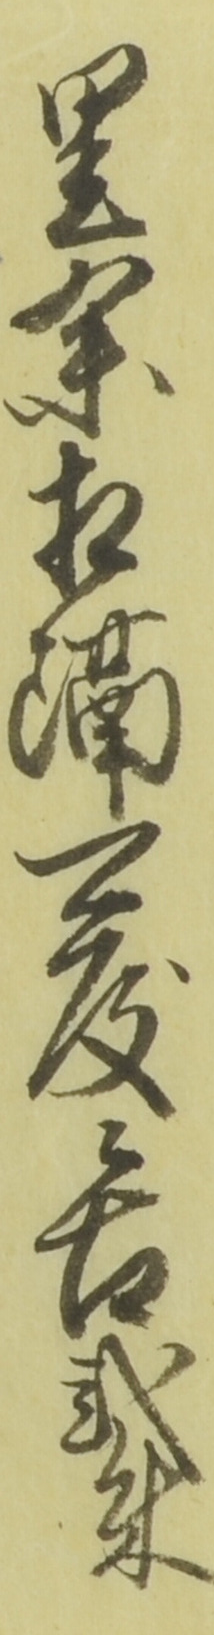里余相場可度ニ古弐朱
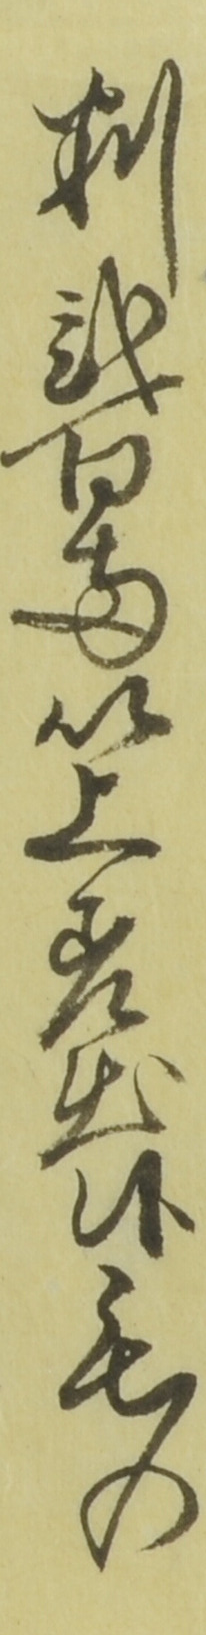判弐百両以上差出候もの
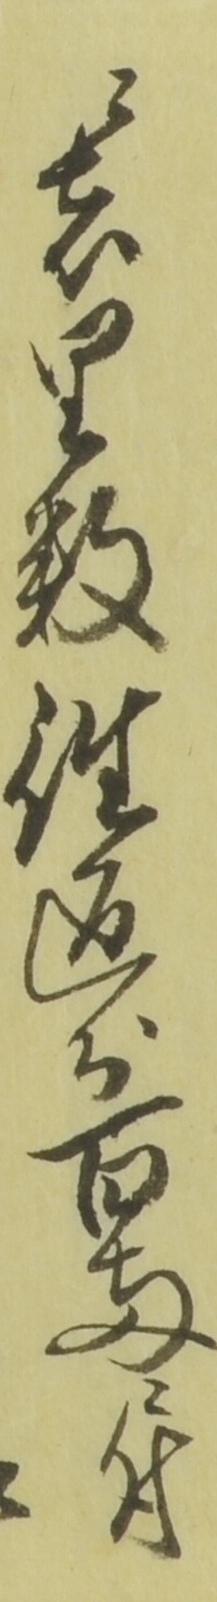ニは里数往返分百両ニ付
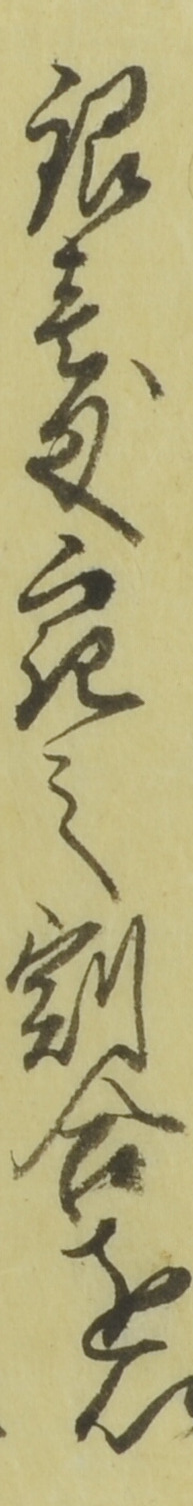銀壱匁宛之割合を以
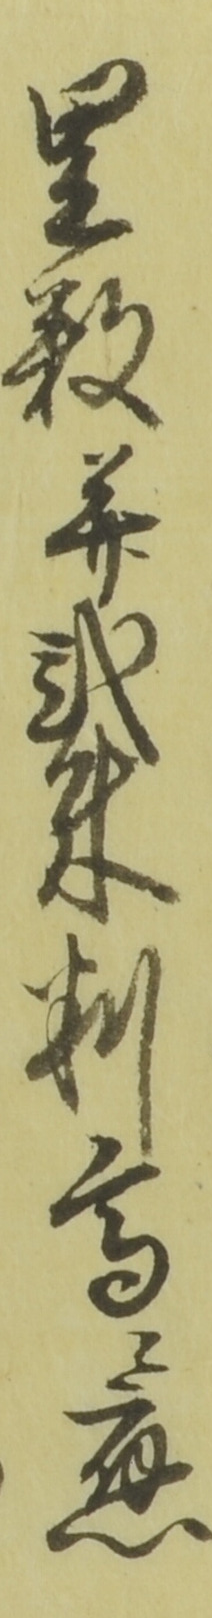里数并弐朱判高ニ応
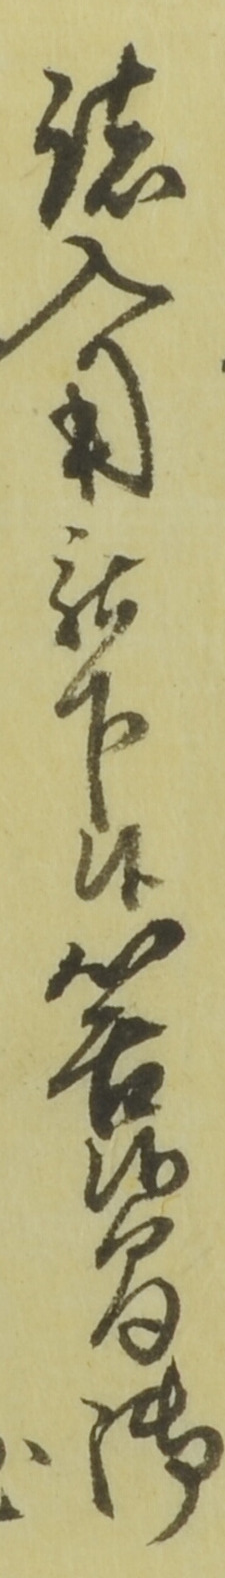諸入用被下候筈候間御
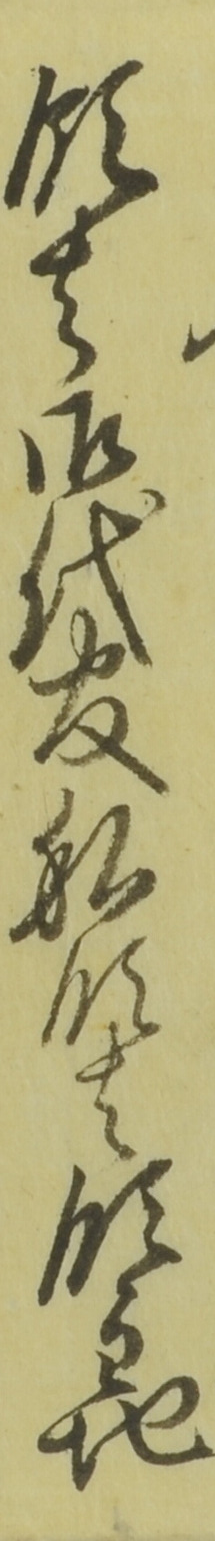領は御代官私領は領主地
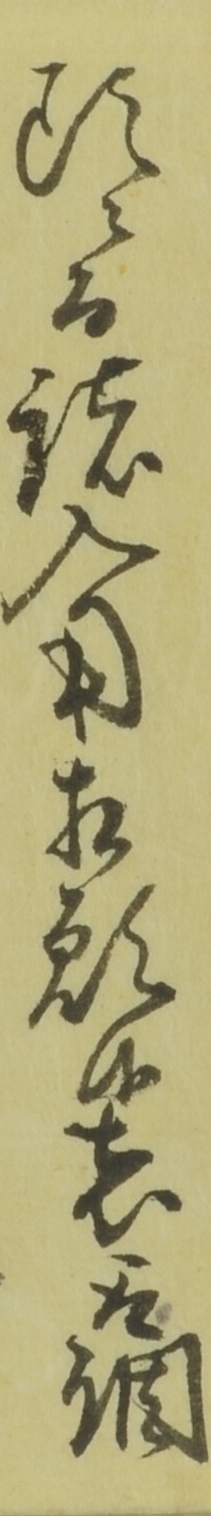頭ニ而諸入用相願候は取調
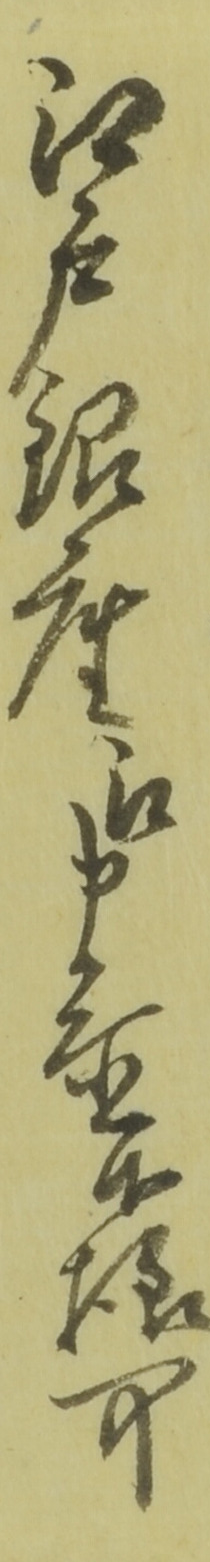江戸銀座江申置候様可
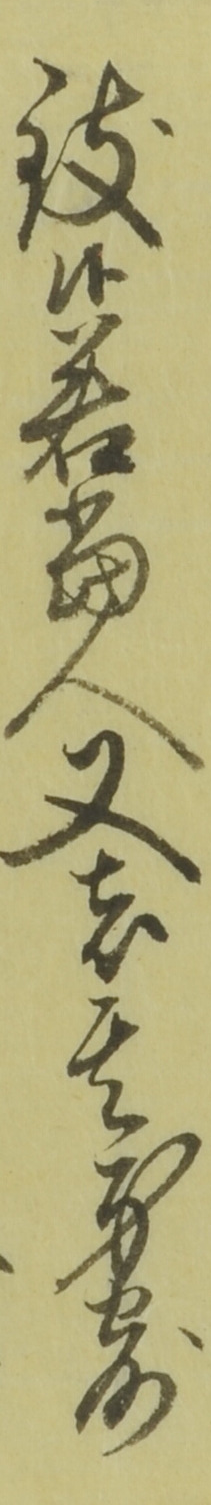致候若当人又は其身寄
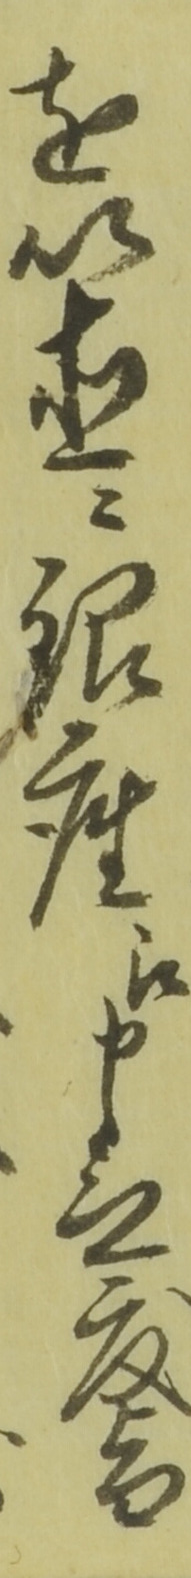を以直ニ銀座江申立度旨
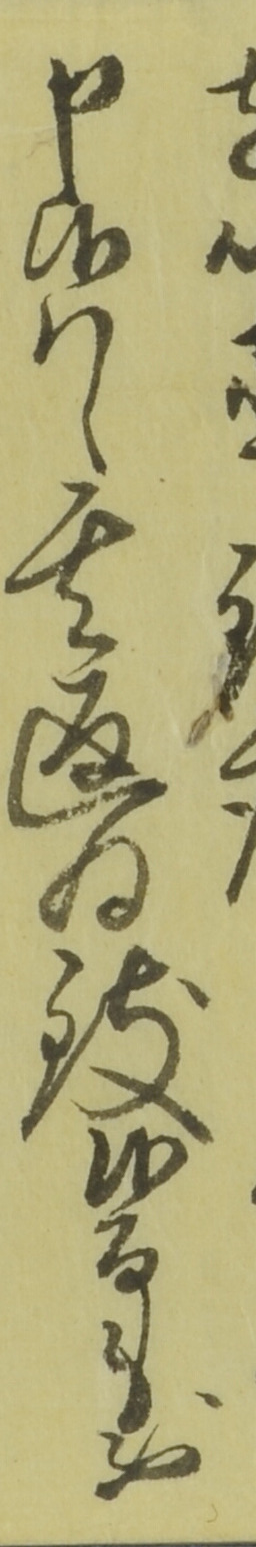申候ハヽ其通為致候而身不
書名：御触書御書附控
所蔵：伊那市立高遠町図書館・合同会社AMANE
